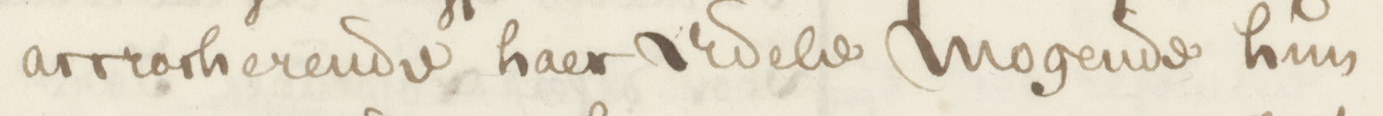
accrocherende haer Edele Mogende hun
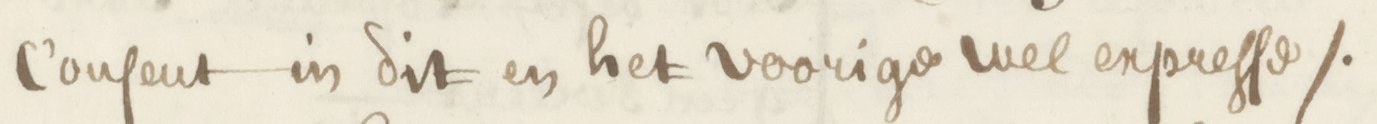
consent in dit en het voorige wel expresse.
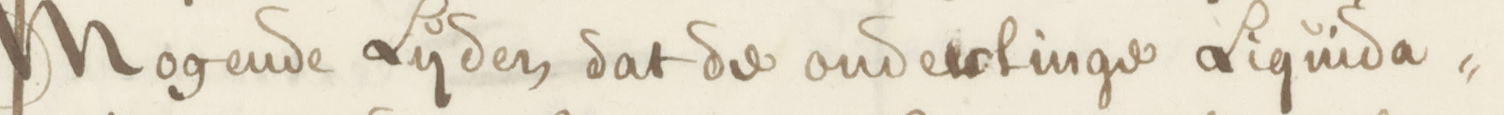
Mogende Lijden dat de onderlinge Liquida„
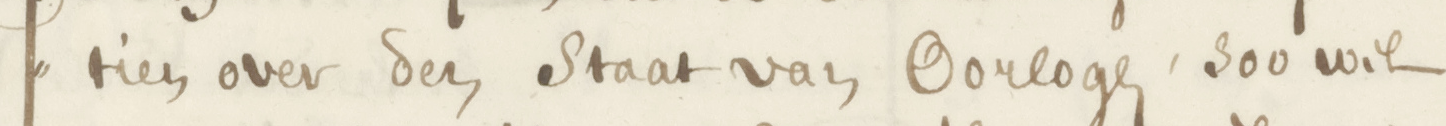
„tien over den Staat van Oorloge, soo wel
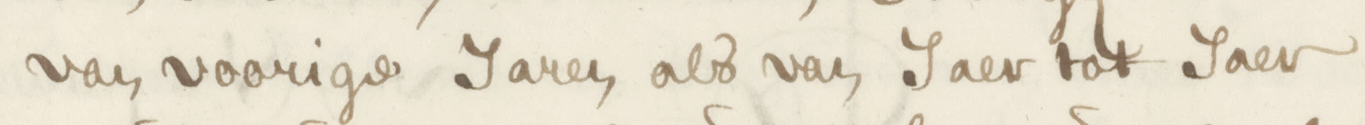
van voorige Jaren als van Jaer tot Jaer
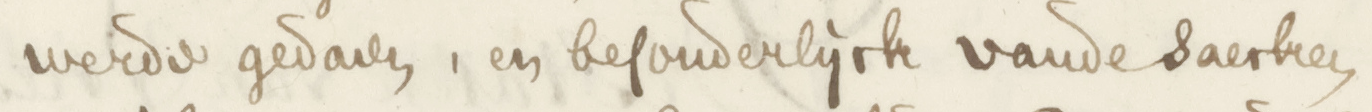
werde gedaen, en besonderlijck vande saecken
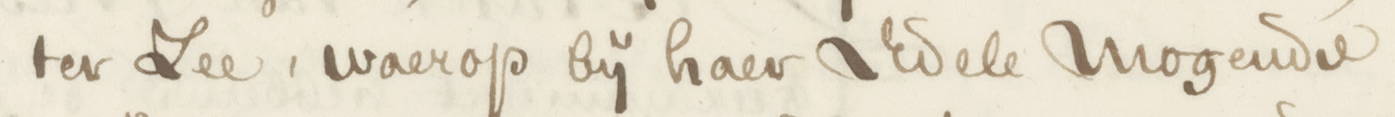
ter Zee, waerop bij haer Edele Mogende
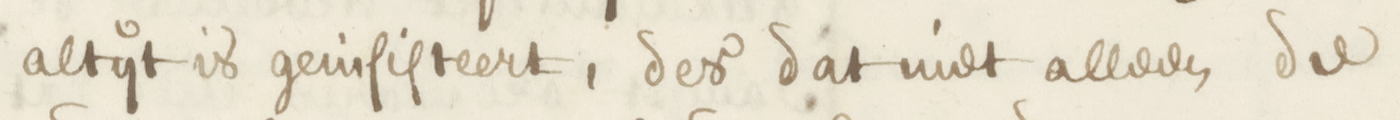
altijt is geinsisteert, des dat niet alleen de
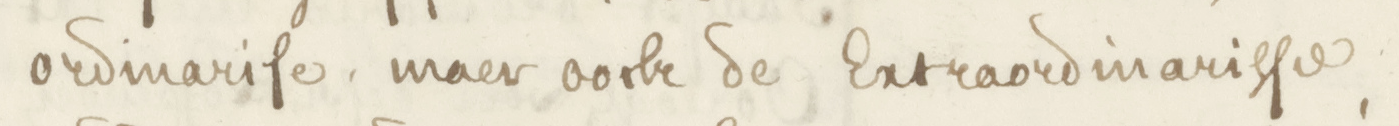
ordinarise, maer oock de Extraordinarisse
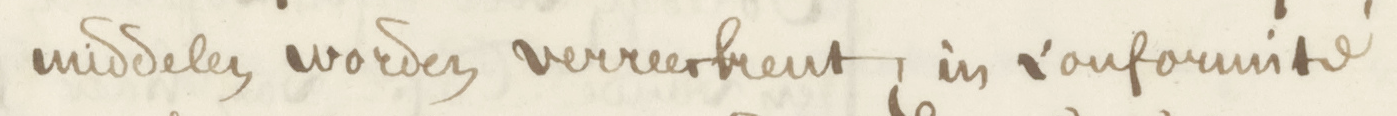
middelen worden verreeckent, in conformité
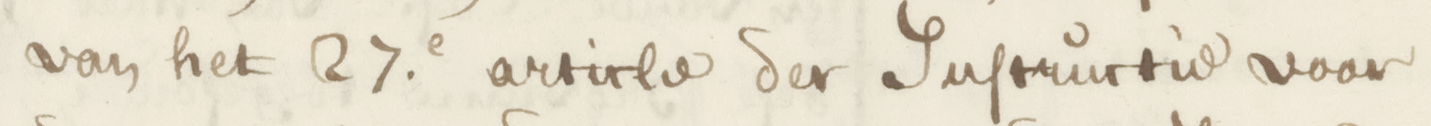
van het 27e. article der Instructie voor
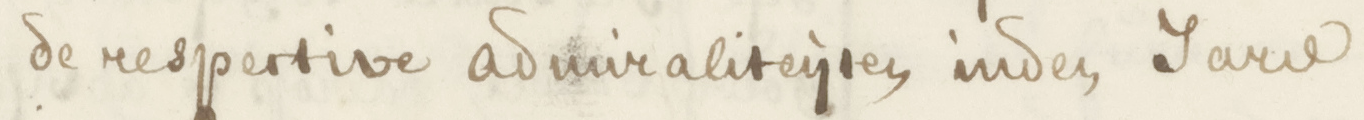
de respective admiraliteijten inden Jare
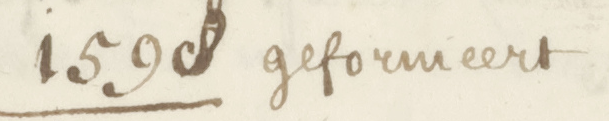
1598 geformeert
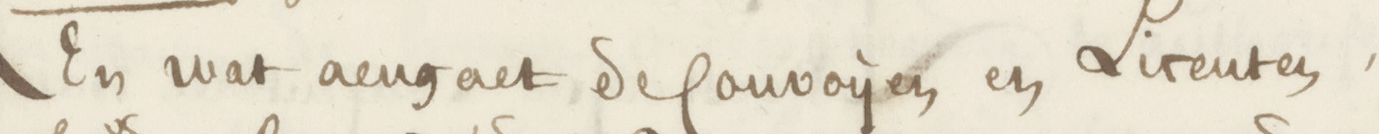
En wat aengaet de Convoijen en Licenten,
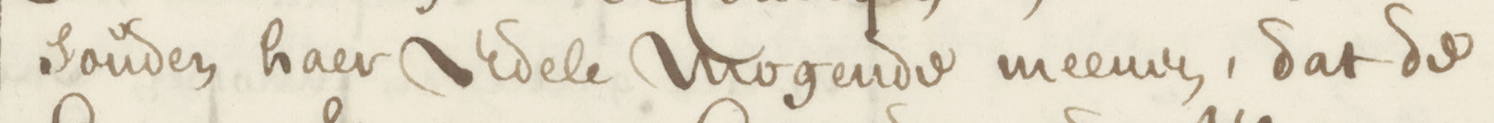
souden haer Edele Mogende meenen, dat de
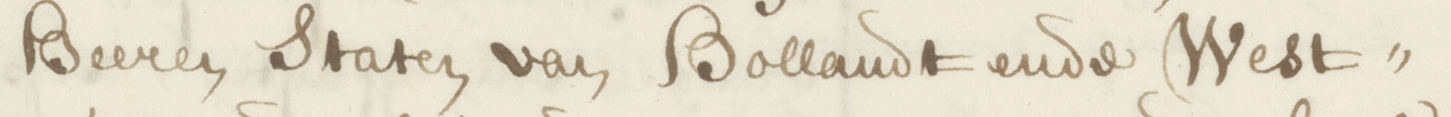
Heeren Staten van Hollandt ende West,,
